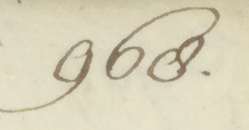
968.
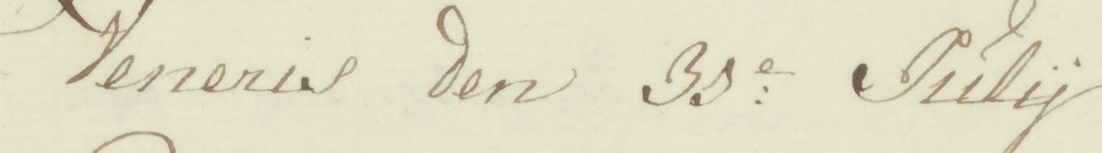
Veneris den 31e: Julij
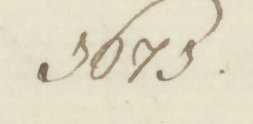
1671.
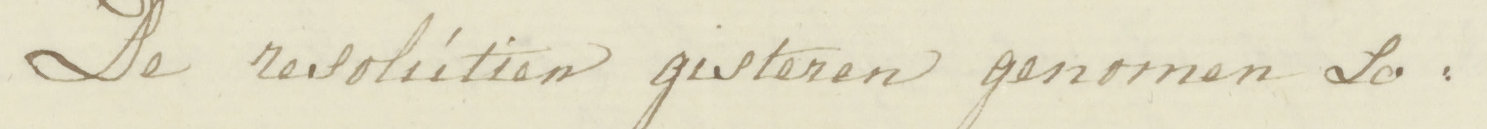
De resolutien gisteren genomen & :
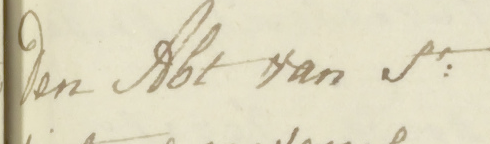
Den Abt van St:
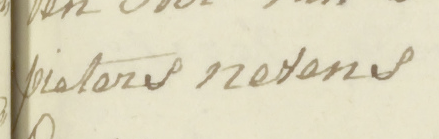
pieters nevens
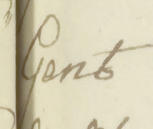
Gent
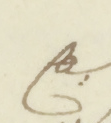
Ca.
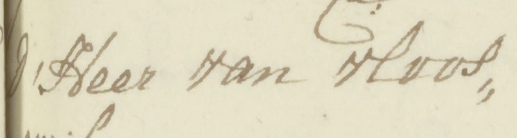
d'Heer van vloos,,
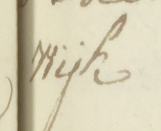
wijk
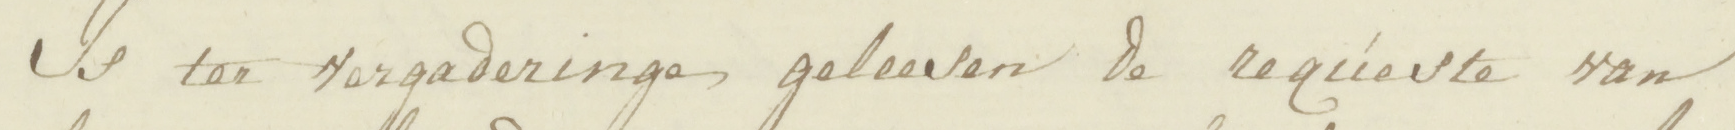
Is ter vergaderinge geleesen de requeste van
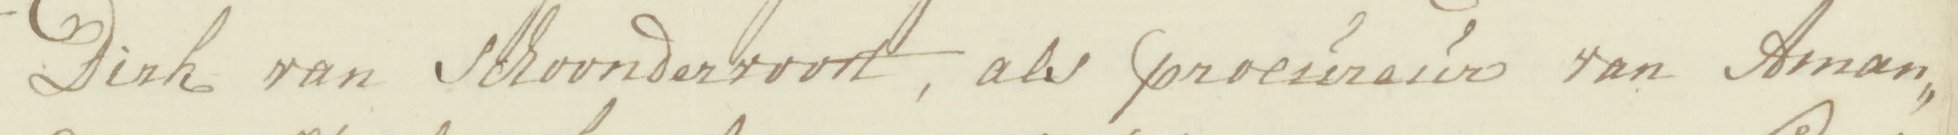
Dirk van Schoondervoort, als procureur van Aman„
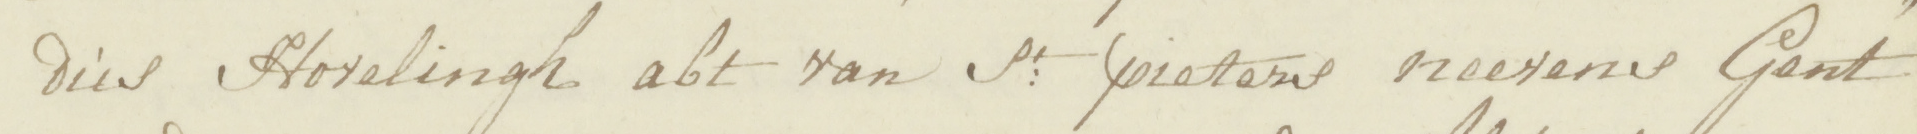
dus Hovelingh abt van St: pieters neevens Gent
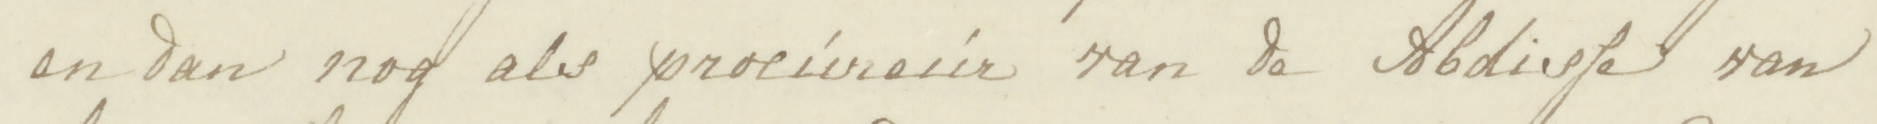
en dan nog als procureur van de Abdisse van
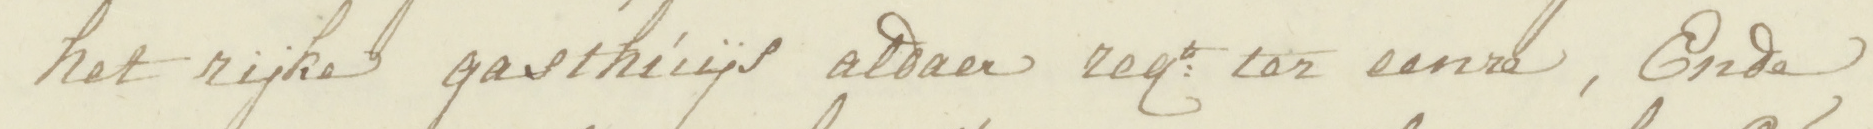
het rijke gasthuijs aldaer reqt: ter eenre, Ende
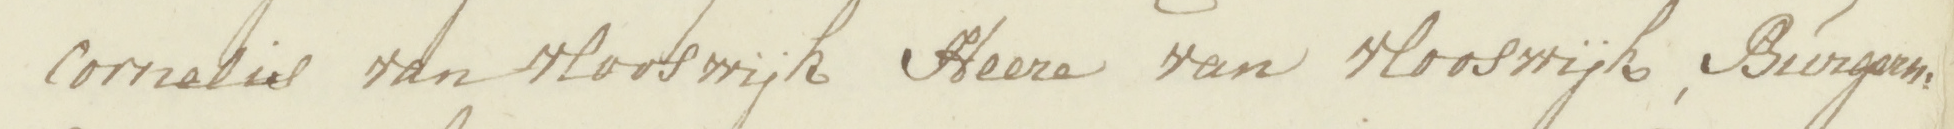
Cornelis van vlooswijk Heere van vlooswijk, Burgerm.
